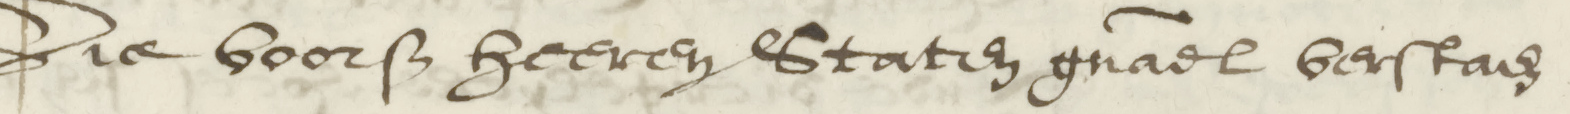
Die voors. heeren Staten Gnael verstaen
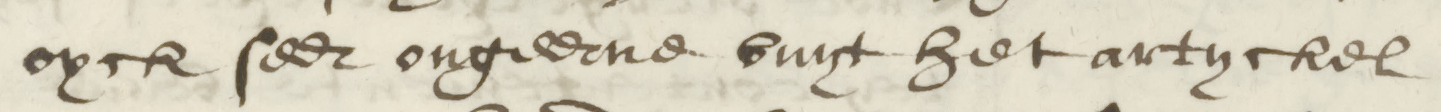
oyck seer ongeerne vuyt het artyckel
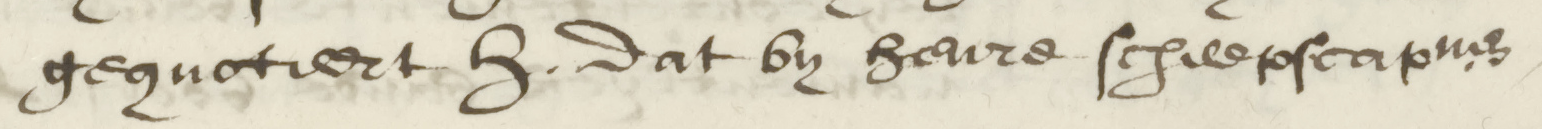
gequoteert H dat by heure scheepscapnen
